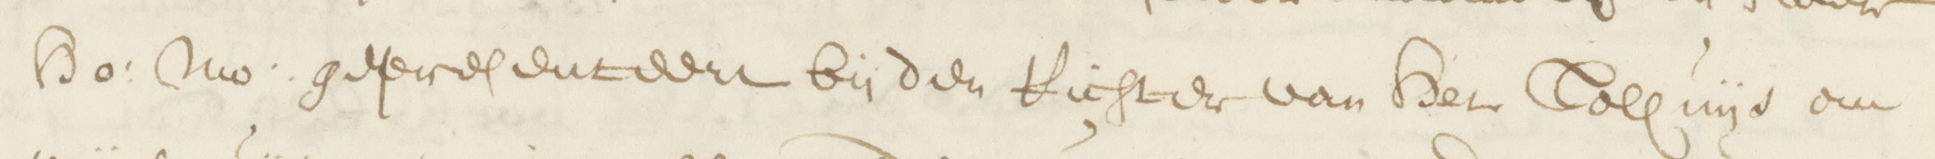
Ho:Mo: gepresenteert bij den Richter van het Tolhuijs om
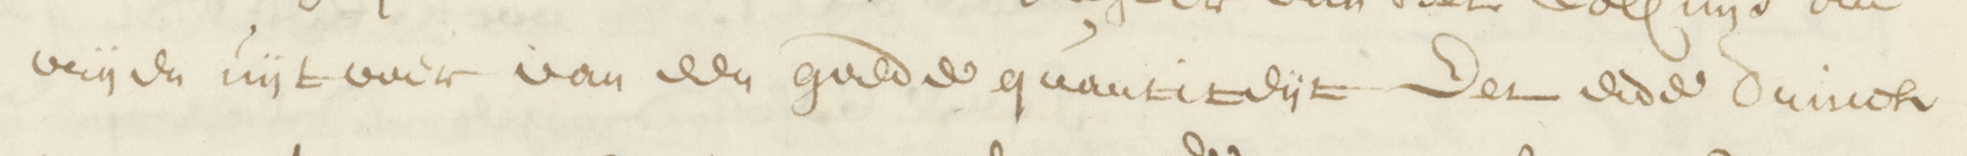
vrijen uijtvoer van een goede quantiteijt Eet ende drinck
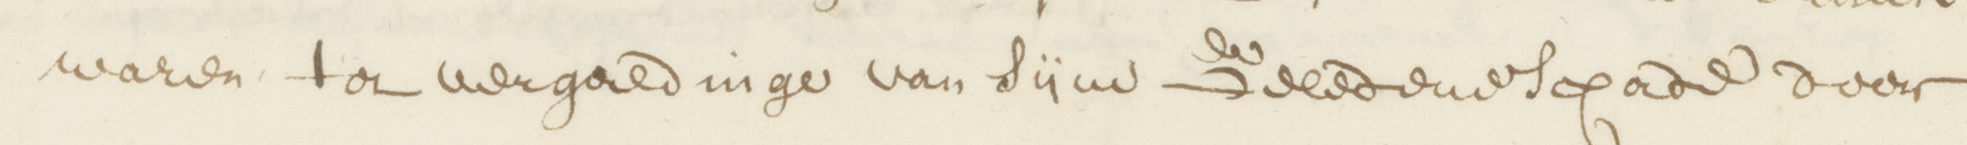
waren ter vergeldinge van sijns Geledene schade door
